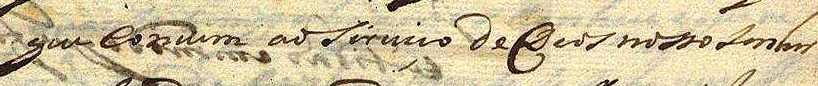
que conuem ao seruiço de Deos nosso senhor
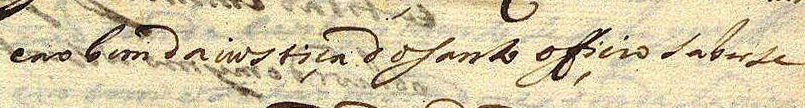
e ao bem da iustiça do santo officio saber se
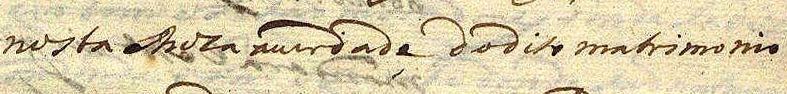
nesta Meza a uerdade do dito matrimonio
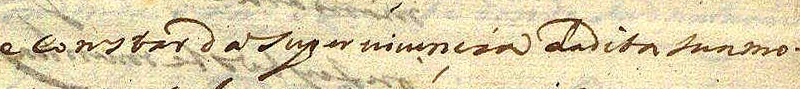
e constar da superuiuencia da dita sua mo
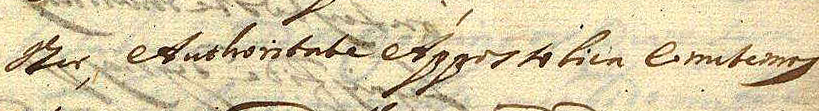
lher, Authoritate Appostolica cometemos
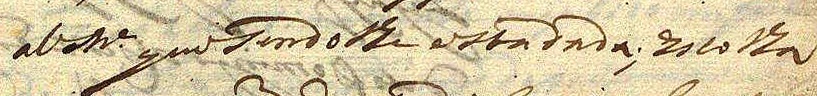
a V M.e que sendolhe esta dada; Escolha
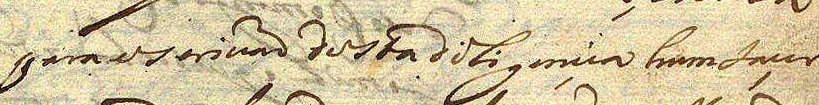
para escriuaõ desta diligencia hum sacer
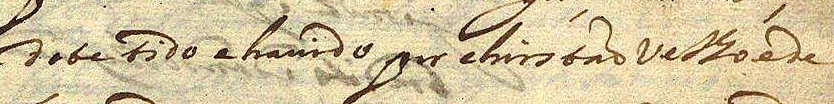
dote tido e hauido por christaõ velho e de
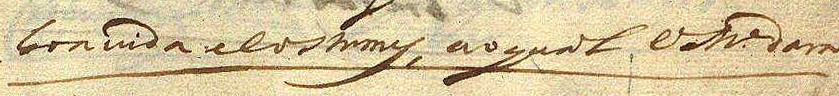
boa uida e costumes, ao qual V M.e dara
